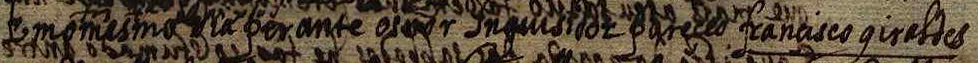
E no mesmo dia perante o snōr Inquisidor pareceo francisco giraldez
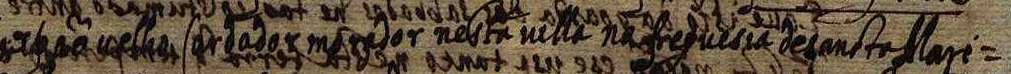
xpaõ uelho Cardador morador nesta uilla na freguesia de Sancta Mari
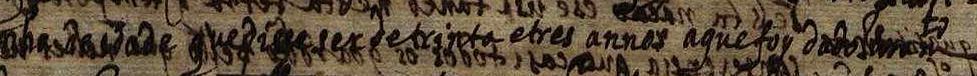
nha de idade que disse ser de trinta e tres annos a que foy dado Iuramto
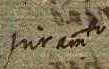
juramto
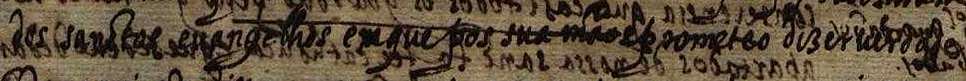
dos sanctos euangelhos em que pos sua mão e prometeo dizer uerdade
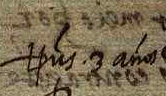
tpūs. 3 an̄os
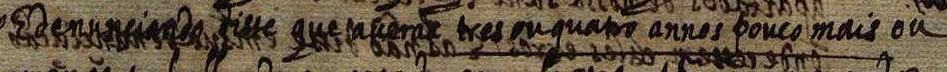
E denunciando disse que auera tres ou quatro annos pouco mais ou
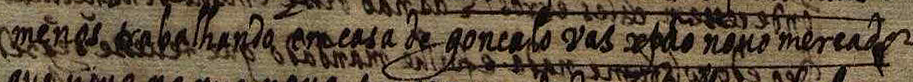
menos trabalhando em casa de gonçalo vaz xpão nouo mercador
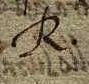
R.
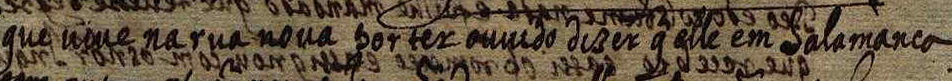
que uiue na rua noua por ter ouuido dizer q̄ elle em Salamanca
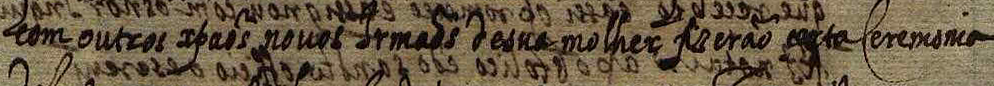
com outros xpãos nouos Irmaõs de sua molher fizerão certa Ceremonia
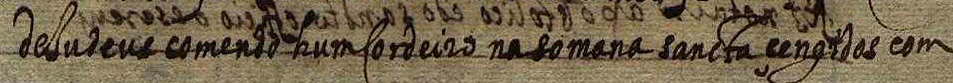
de Iudeus comendo hum Cordeiro na somana sancta cengidos com
